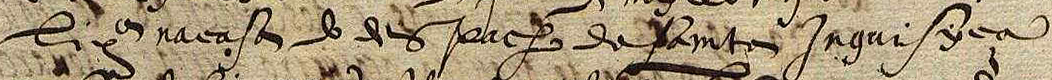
lixa na casa do despacho da samta Jnquisyçā
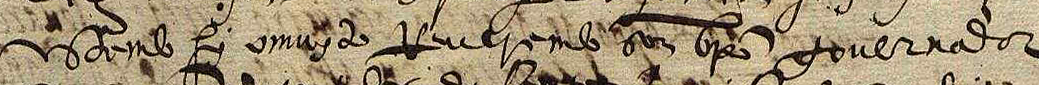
estamdo hy o muyto Reuerendo sōr bpō gouernador
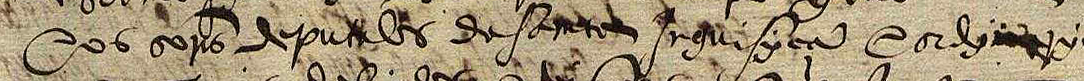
e os sor̄s deputados da samta Jnquisyçā e ordynaryo
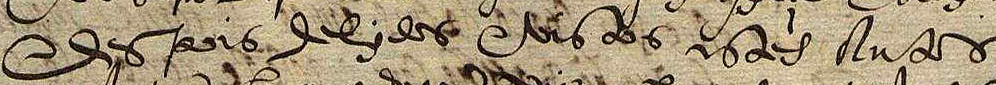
e despois de lydos e vistos estes Autos
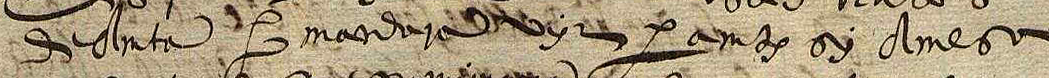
de Antā ho mandarā vyr ꝑamte sy A mesa
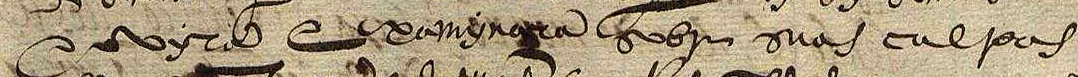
e o vyrā e examynarā sobre suas culpas
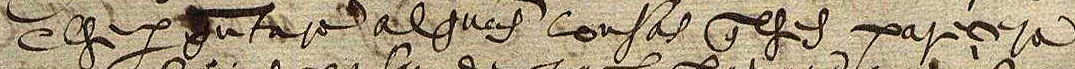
e lhe ꝑgūtarā alguās cousas q̄ lhes parecerā
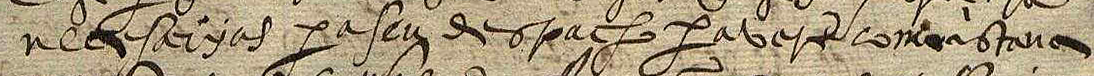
necesaryas ꝑa seu despacho ꝑa verē como estaua
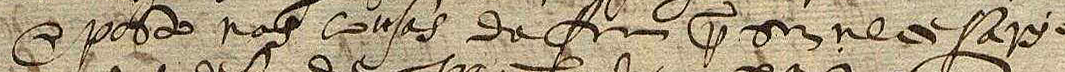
ēposto nas cousas da fee p̄o ser necesaryo
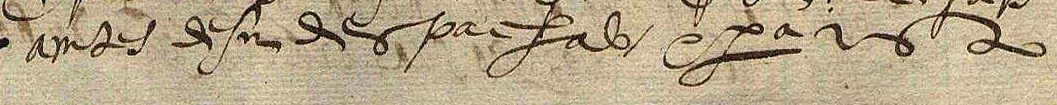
amtes de ser despachado / e ꝑa isto
